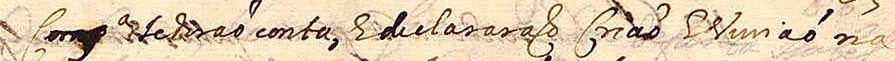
Compa se deraõ conta E declararaõ Criaõ E Viuiaõ na
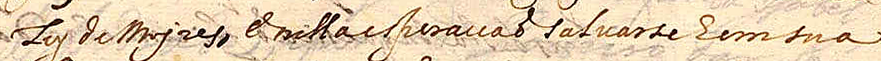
Ley de Mojzes, & nella esperauaõ saluarse E em sua
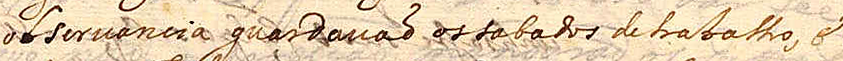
obseruancia guardauaõ os sabados de trabalho, &
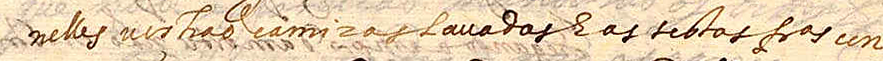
nelles uestiaõ camizas Lauadas E as sestas fras con
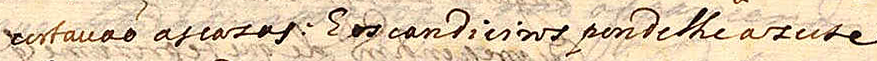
certauaõ as cazas : E os candieiros pondo-lhe azeite
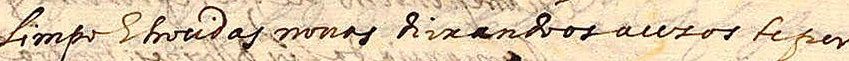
Limpo E trocidas nouas deixandoos acezos te per
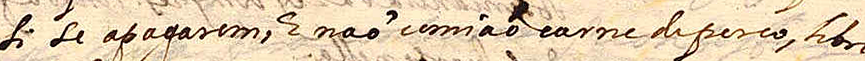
si se apagarem, E naõ comiaõ carne de porco, lebre
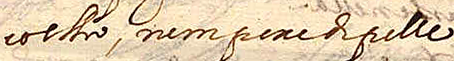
coelho, nem pexe de pelle
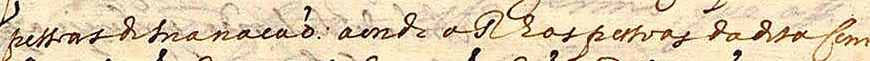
pessoas de sua nacaõ : aonde a R E as pessoas da dita Com
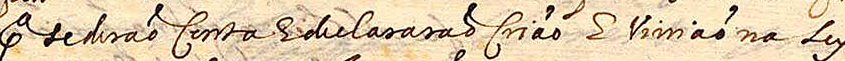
pa se deraõ Conta E declararaõ Criaõ E Viuiaõ na Ley
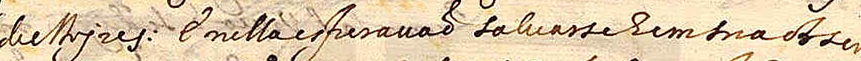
de Mojzes: & nella esperauaõ saluarse E em sua obser
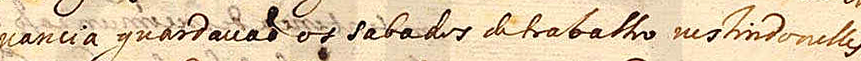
uancia guardauaõ os sabados de trabalho uestindo nelles
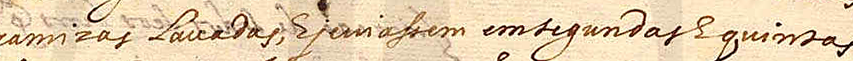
camizas Lauadas, E jeiuassem em segundas E quintas
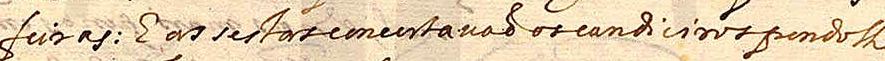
feiras: E as sestas concertauaõ os candieiros pondolhe
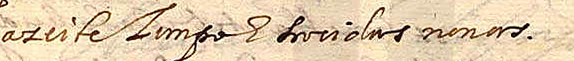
azeite Limpo E trocidas nouas.
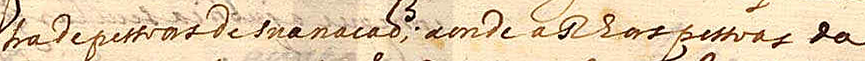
tra de pessoas de sua nacaõ; aonde a R E as pessoas da
